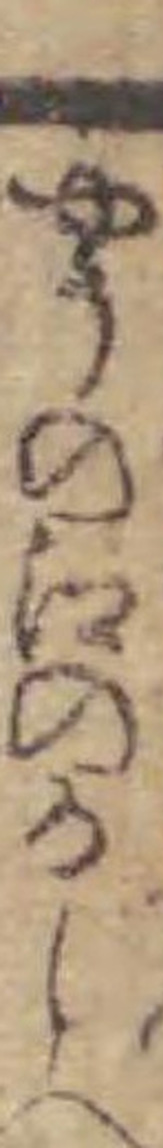やうの江のかし
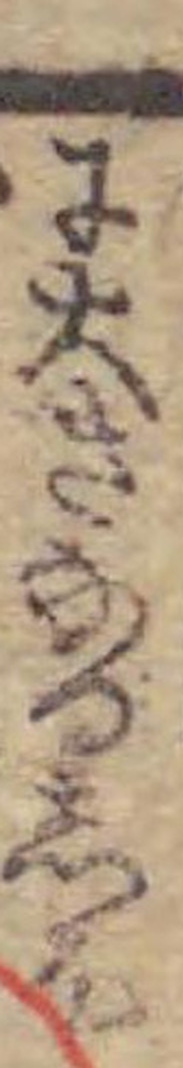に大きなるしほ
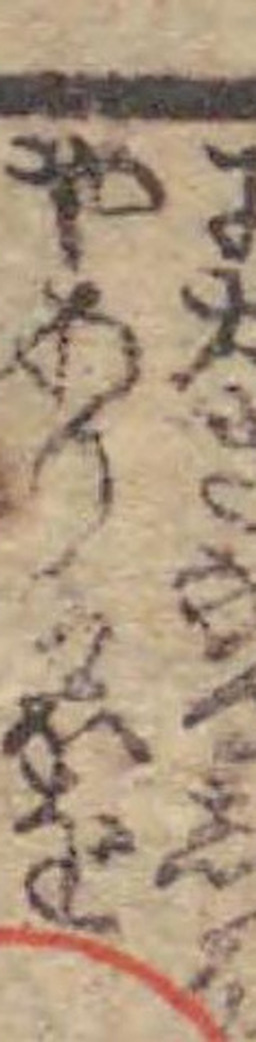やあり名を
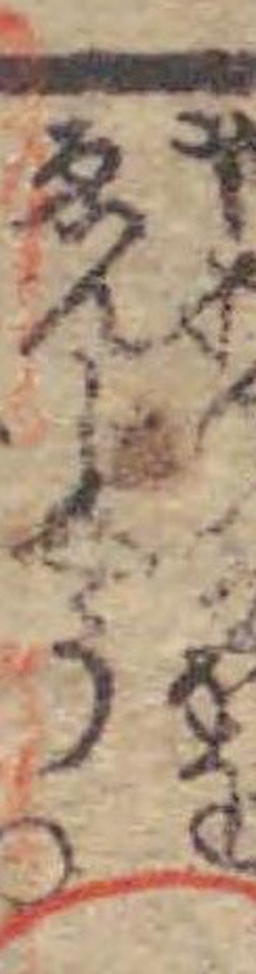ゑんじやう
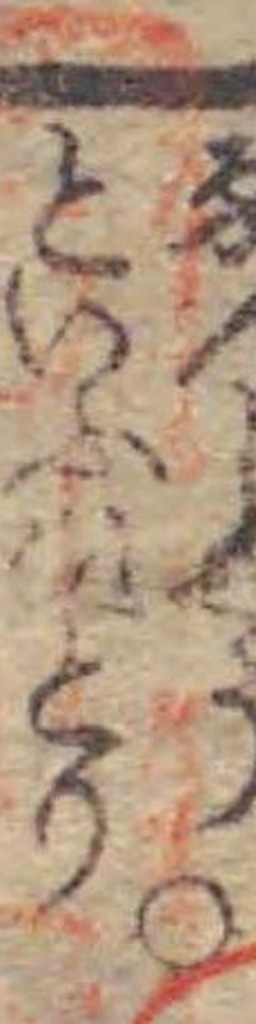といふひとり
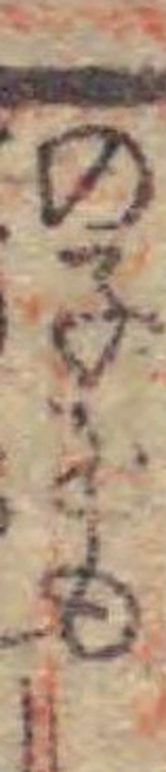の子をも
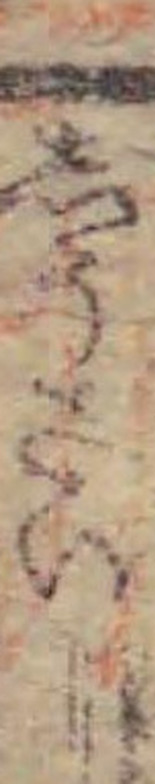しうさい
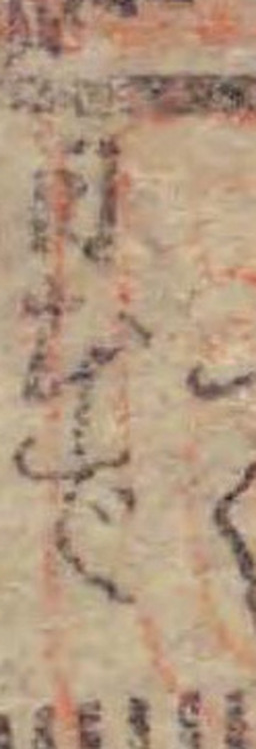日本で
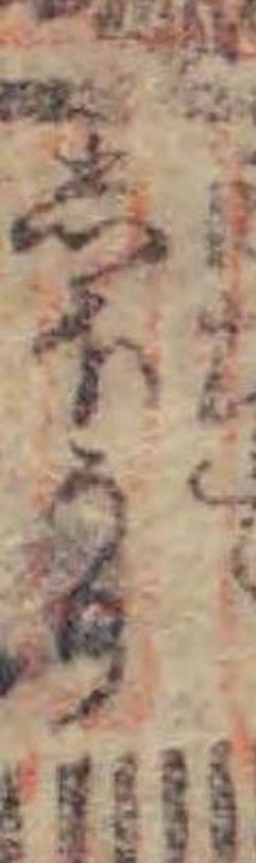しほうり
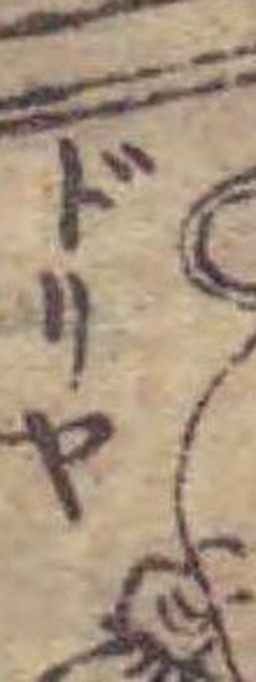ドリヤ
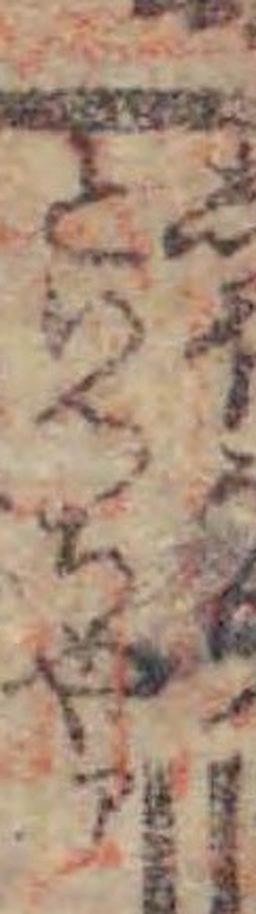といつちやァ
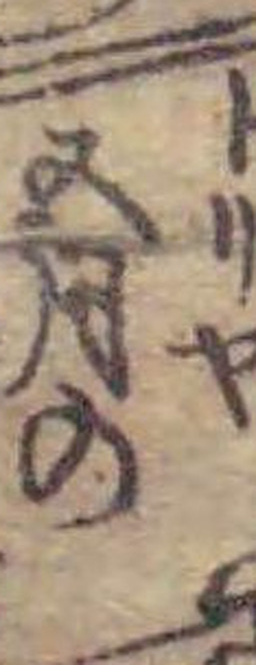五月の
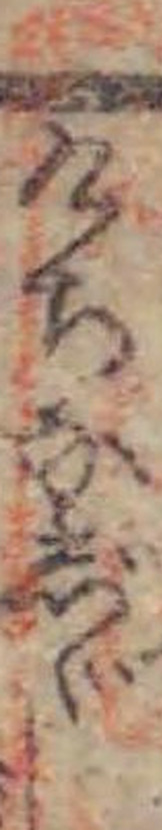けちなじゝ
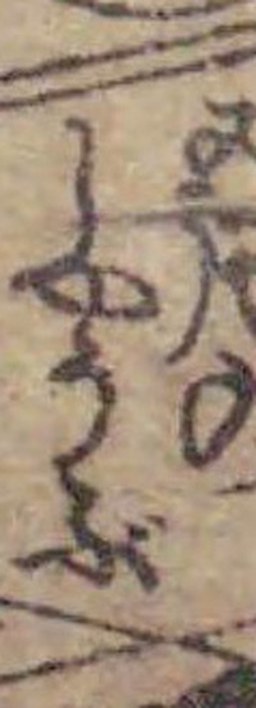しやうぶ
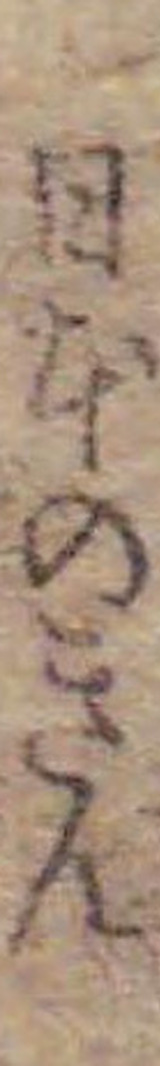日本のきん
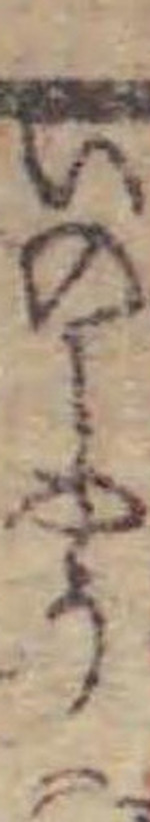いのしやう
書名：此奴和日本 : 2巻
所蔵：国立国会図書館 National Diet Library, JAPAN
